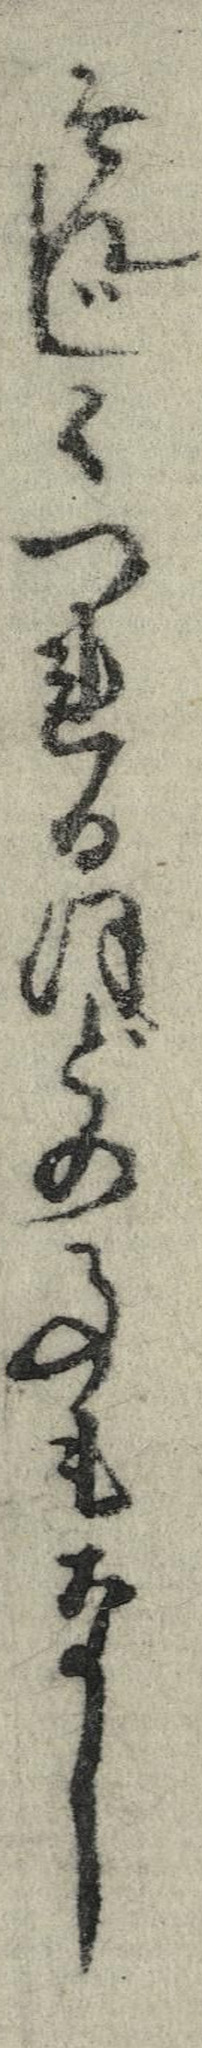そんじくつれるほどの事もなし
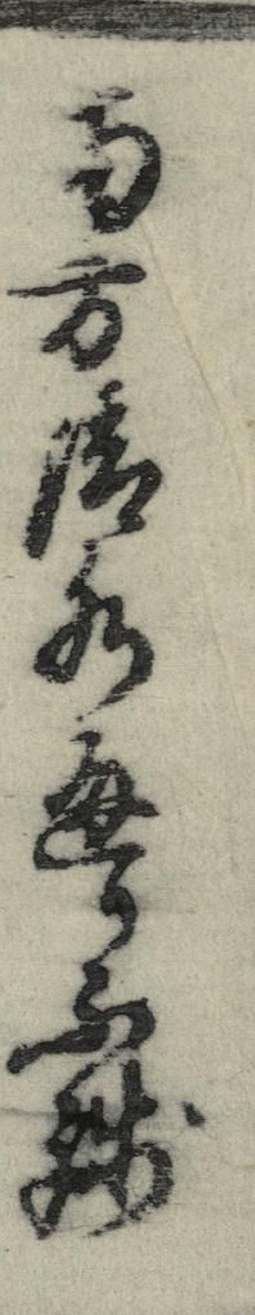南方清水通り不残
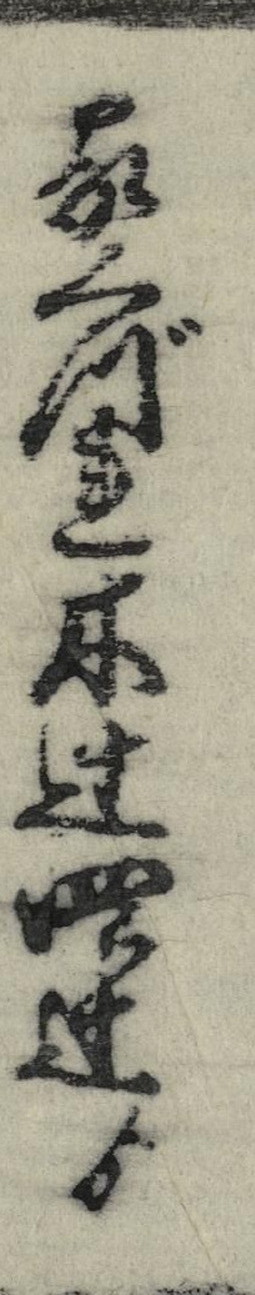家くづれ木辻四ツ辻ゟ
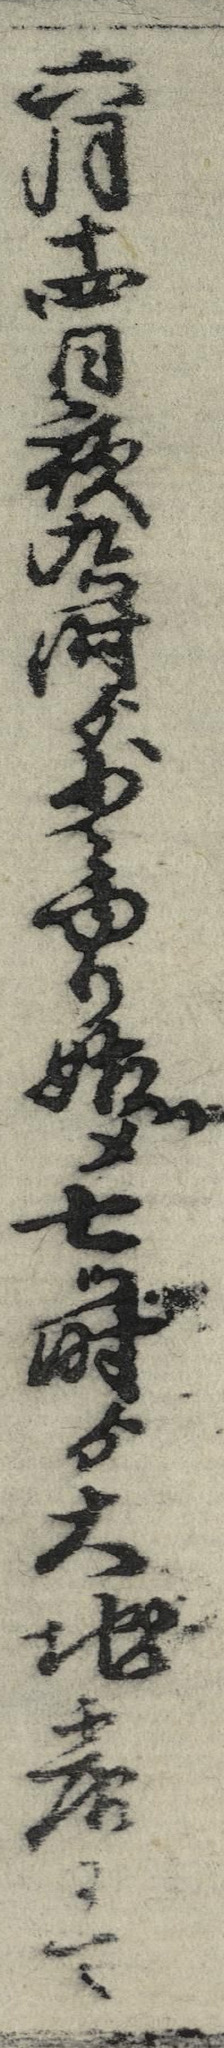六月十四日夜九ツ時ゟ少々ゆる始め七ツ時ゟ大地震にて
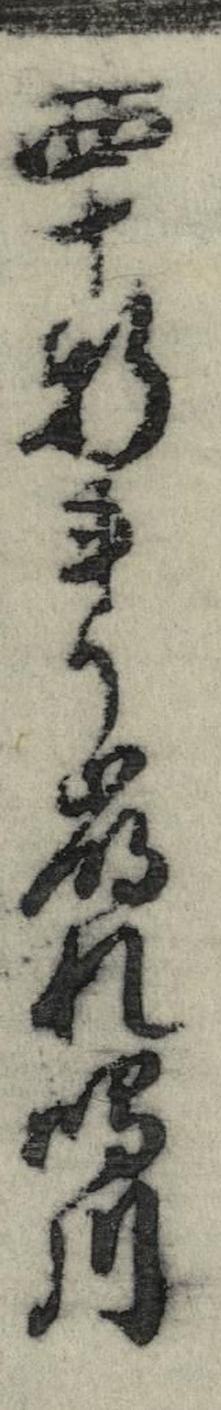西十軒来り崩れ鳴川
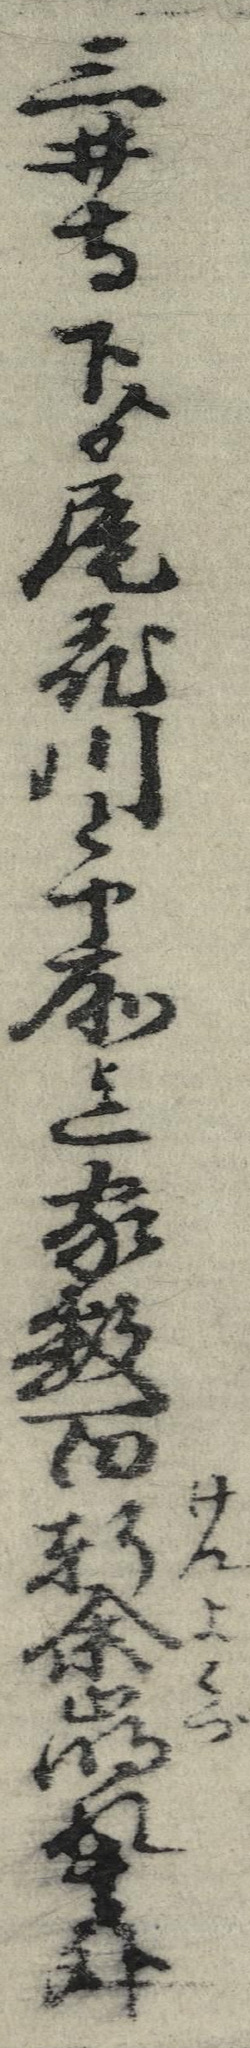三井寺下ゟ尾花川と申所迄家数百軒余崩れ其外
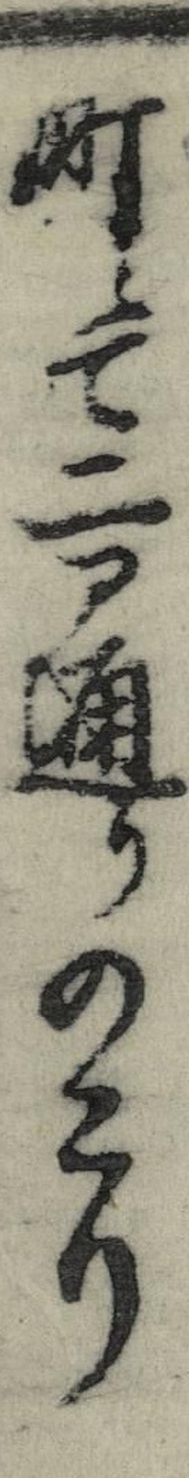町にて二部通りのこり
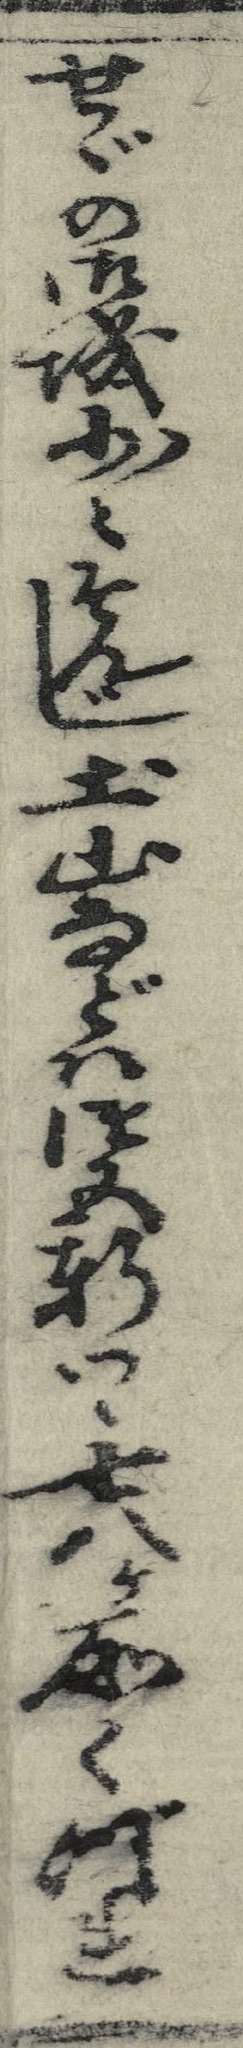せゞの御城少々そんじ土山などは四五軒ツゝ七八ケ所くつれ
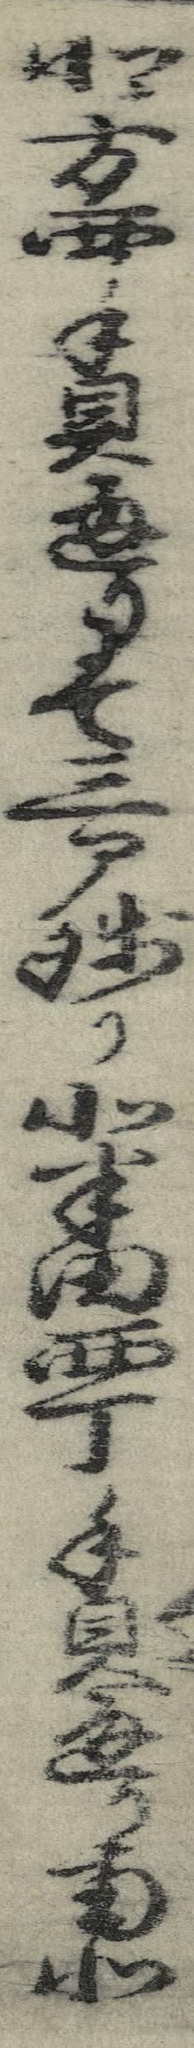北方西手貝通りにて三部残り北半田西丁手貝通り南北
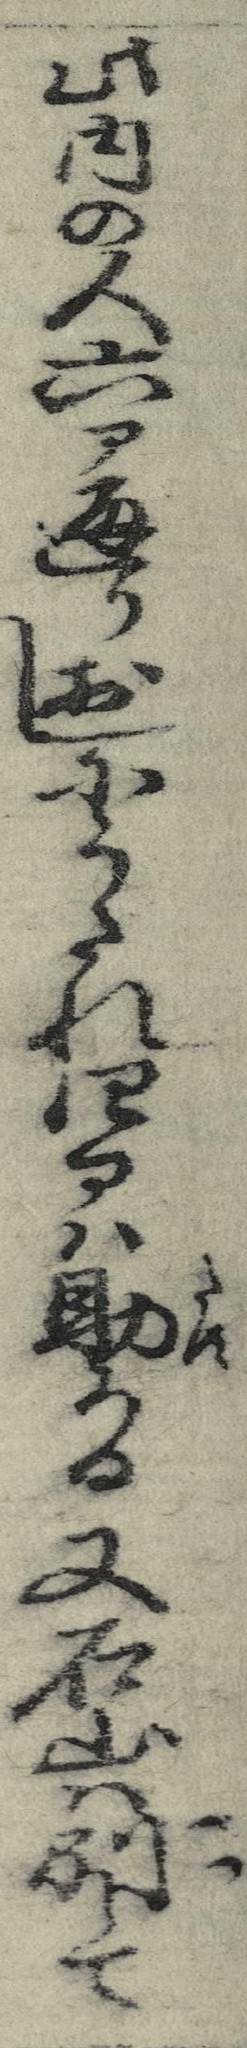此内の人六部通りおしにうたれ四部は助かる又石山は別して
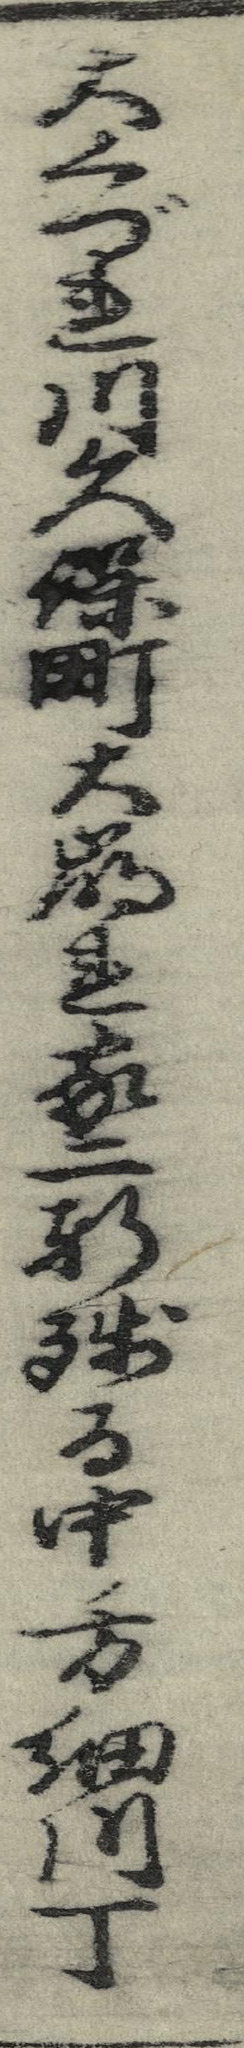大くづれ川久保町大崩れ家三軒残る中ノ方細川丁
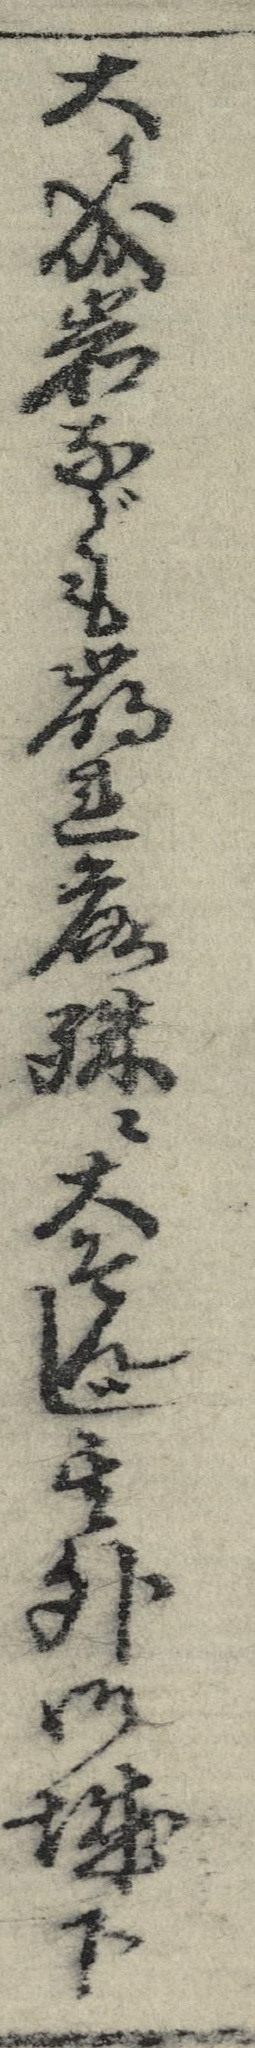大イ成岩なども崩れ落殊に大そんじ其外御城下
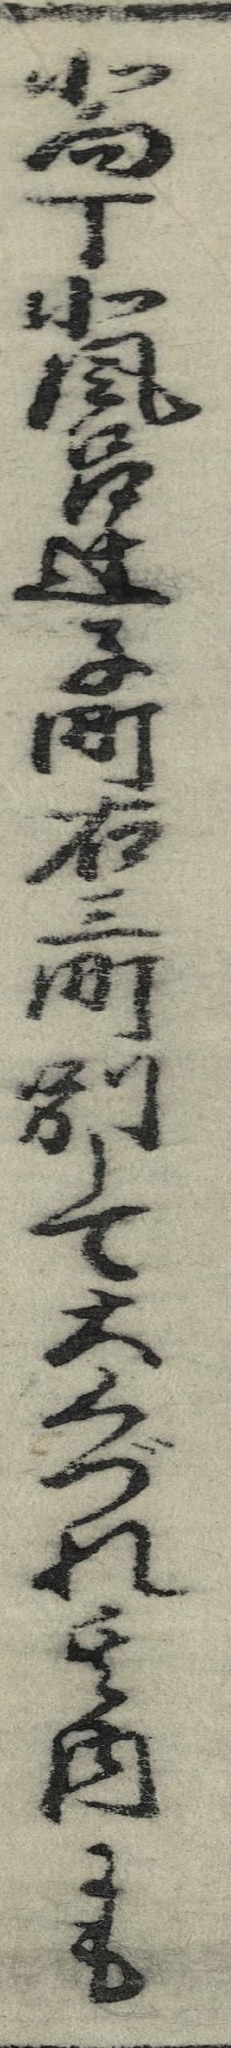北向丁北風呂辻子町右三町別して大くづれ其内にも
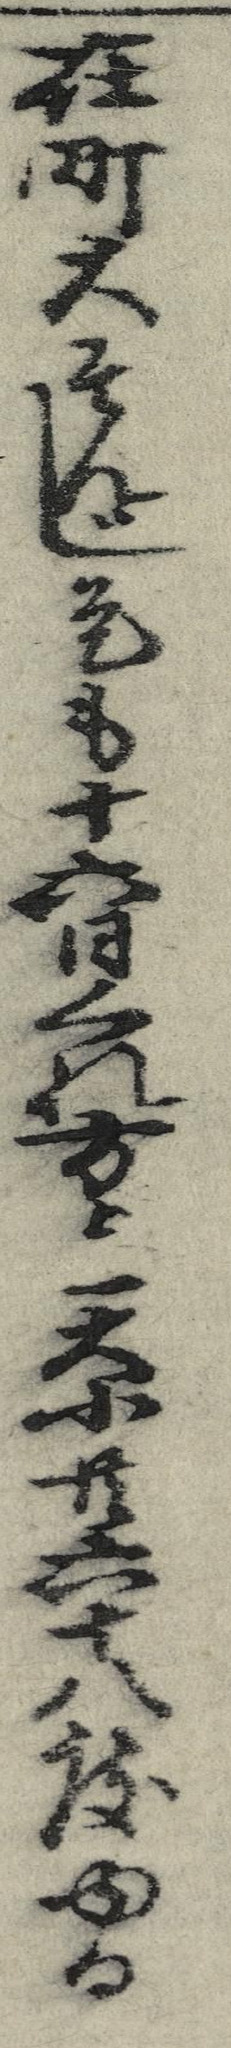在町大そんじ是も十六日くれ方迄大小共六十八度ゆる
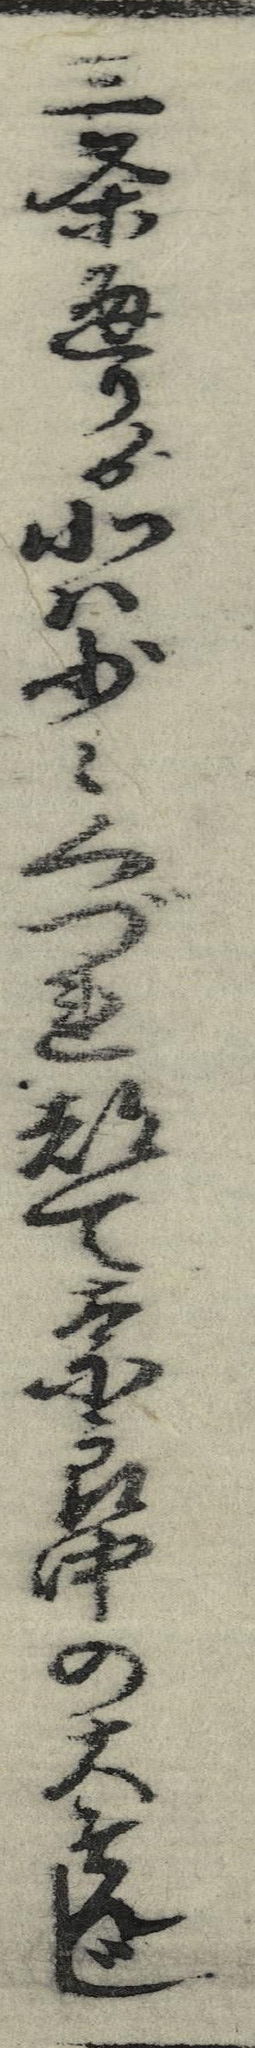三条通りゟ北は少々くづれ都て奈良中の大そんじ
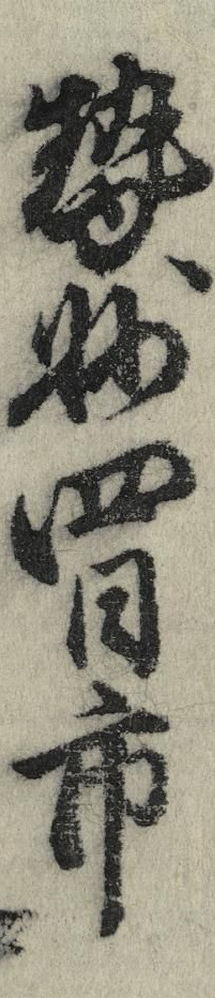勢州四日市
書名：聞書　諸國大地震并ニ出火
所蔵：東京大学地震研究所図書室 Earthquake Research Institute Library, The University of Tokyo, JAPAN
